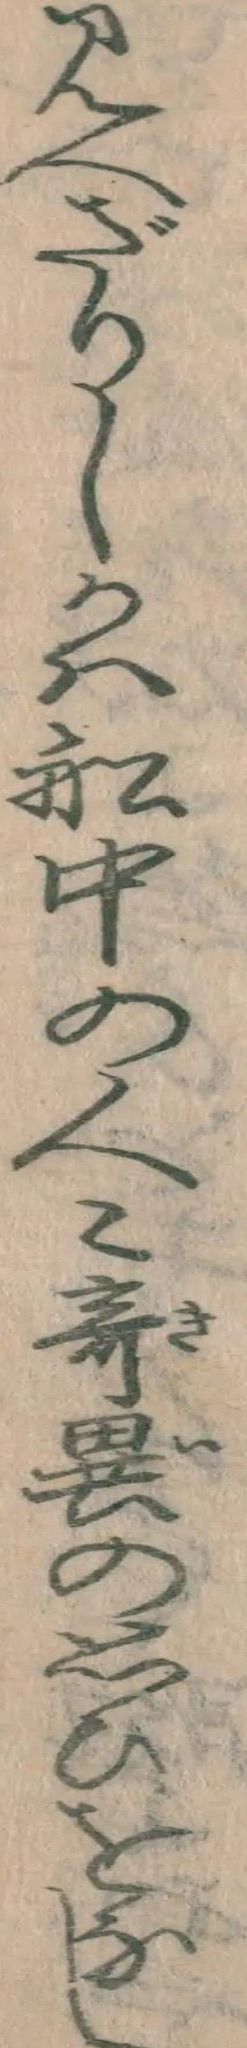見へざりしかは船中の人々奇異の思ひをなし
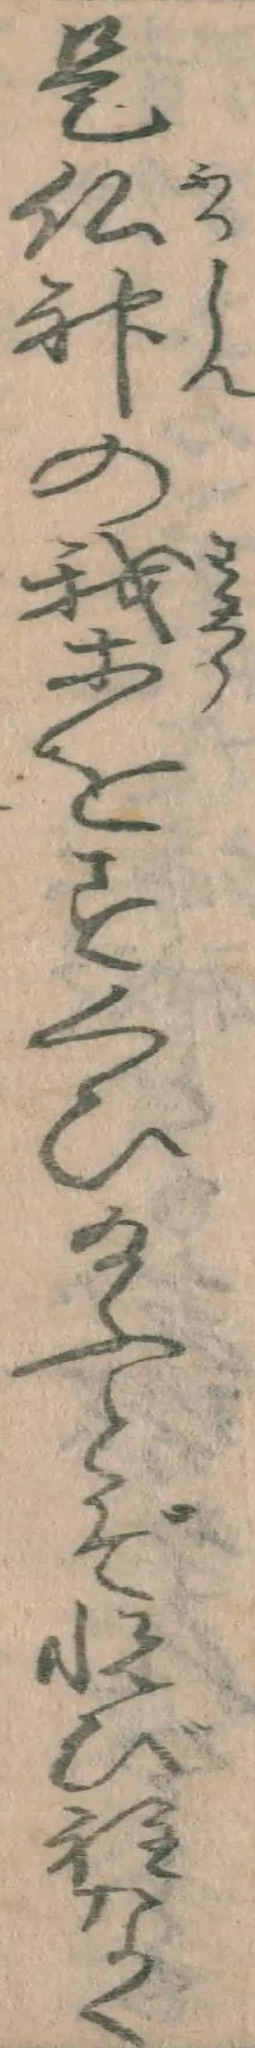是仏神の我等すくひ給ふとぞ悦び程なく
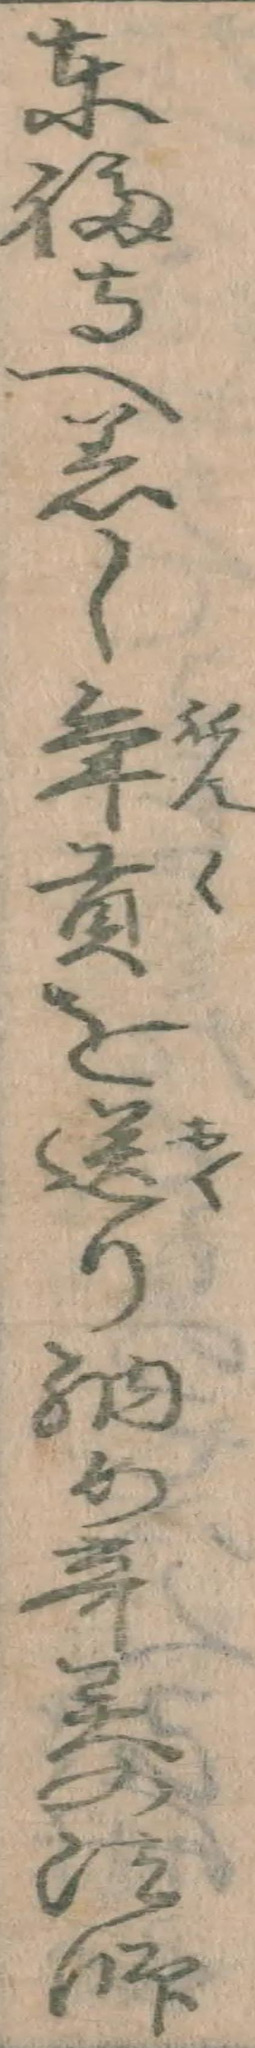東福寺へ着し年貢を送り納め奇異の法師
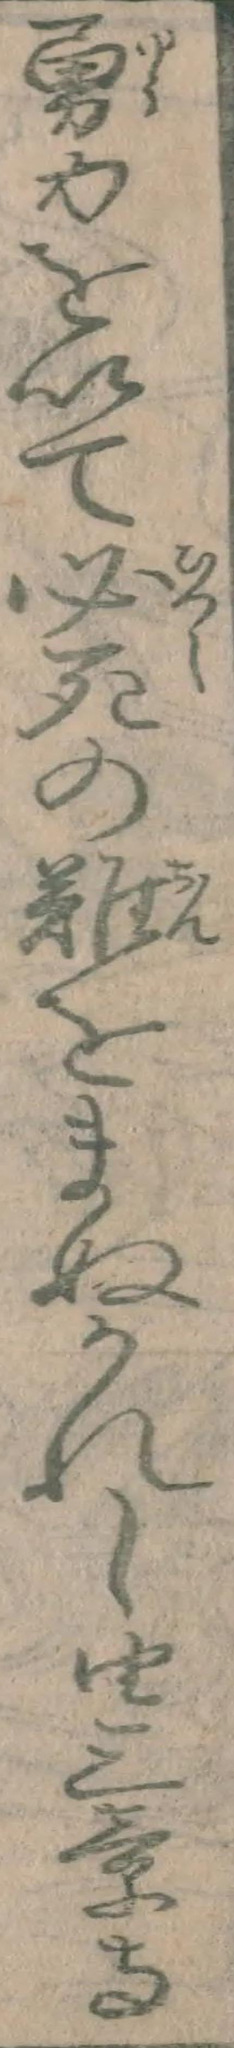勇力を以て必死の難をまぬかれし由三章寺
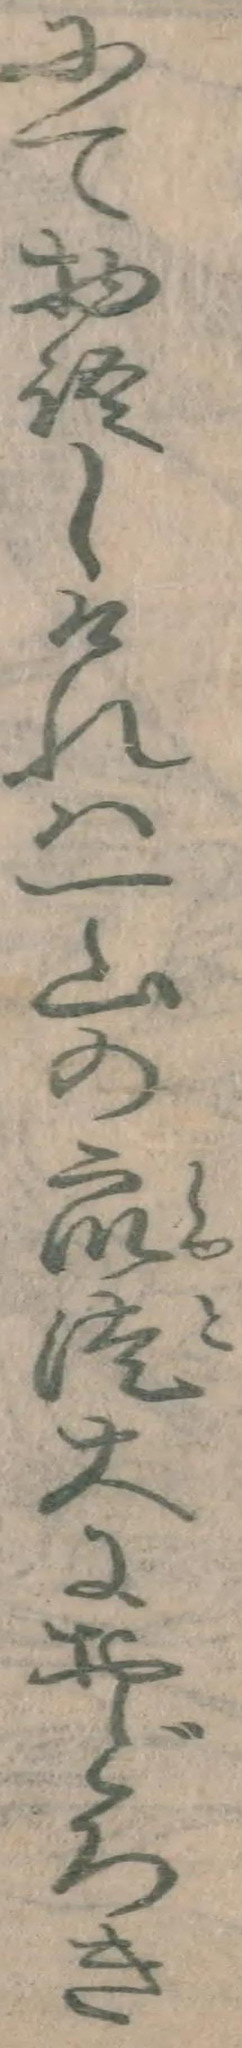にて物語しけれは一山の衆徒大におどろき
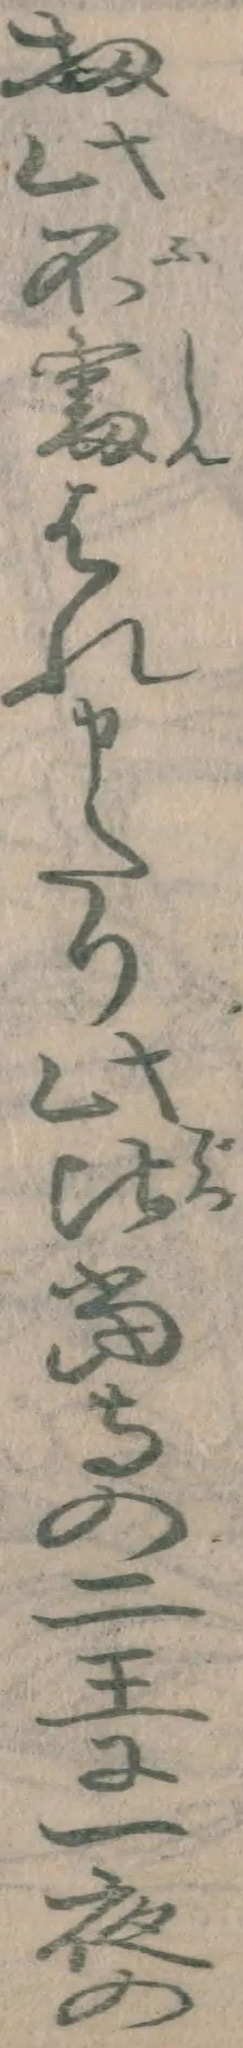扨此不審はれ申たり此頃当寺の二王に一夜の
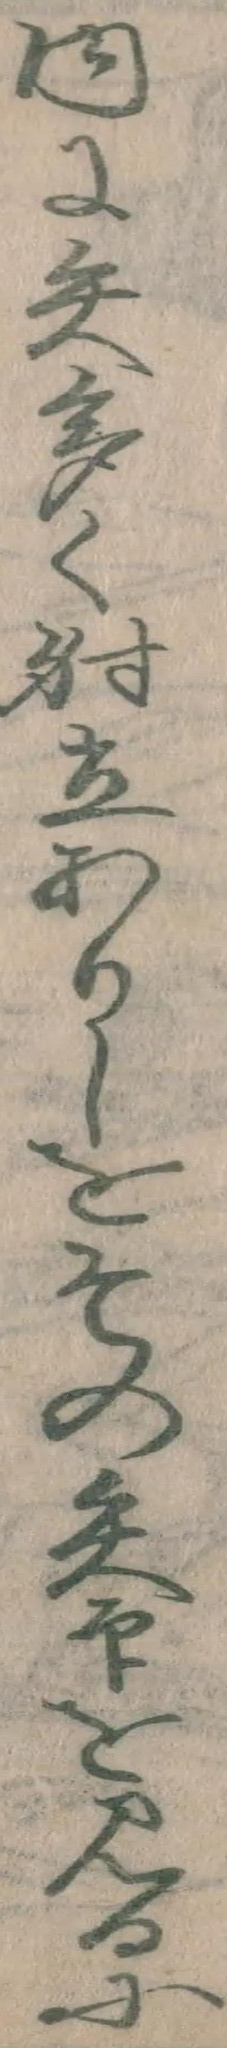内に矢多く射立ありしをその矢印を見るに
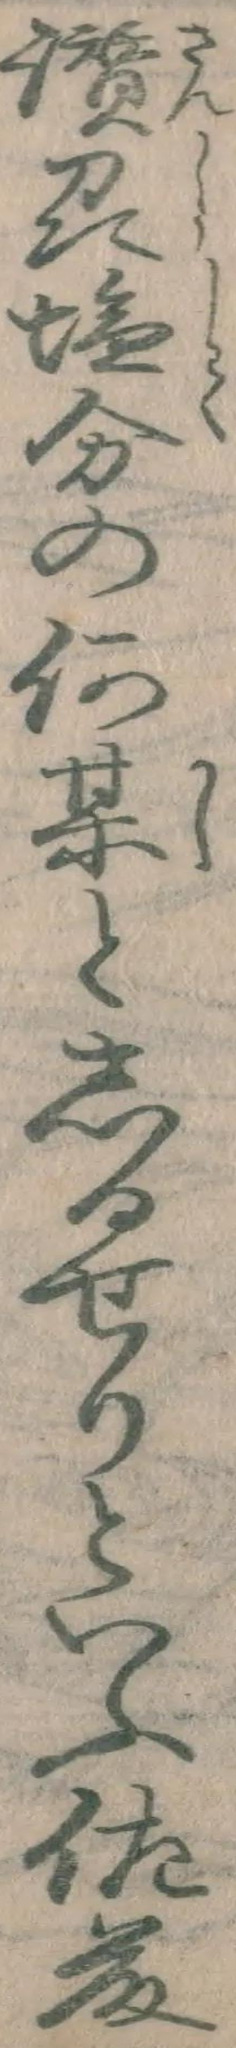讃州塩分の何某としるせりといふ佐藤
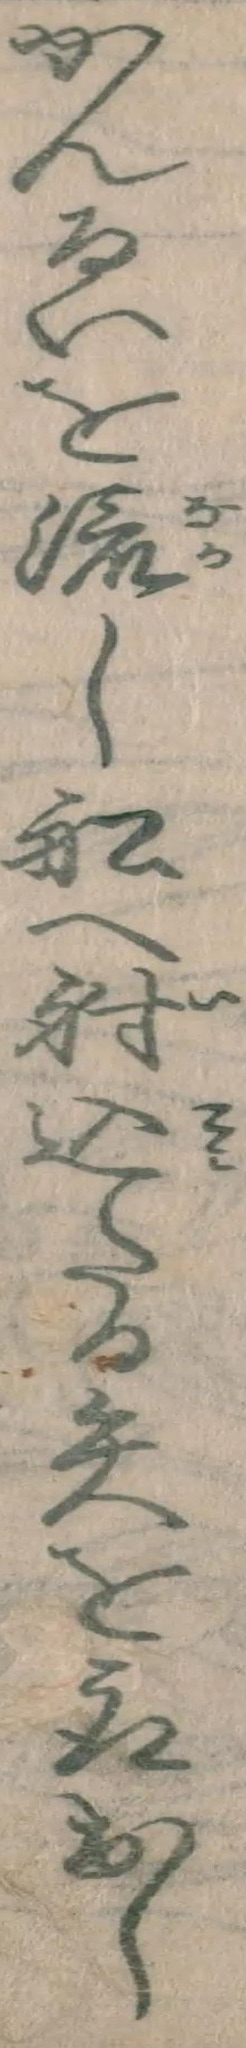かんるいを流し船へ射込たる矢を取出し
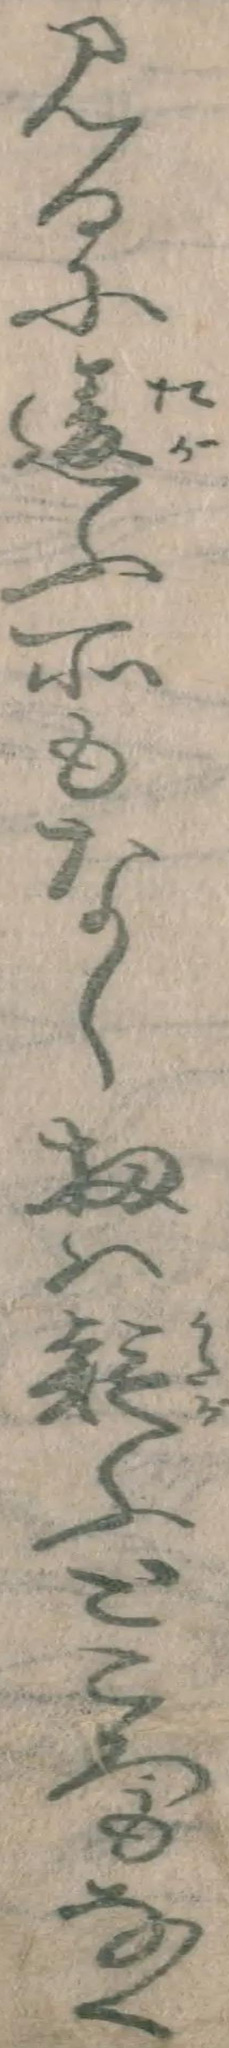見るに違ふ所もなく扨は疑ふところもなく
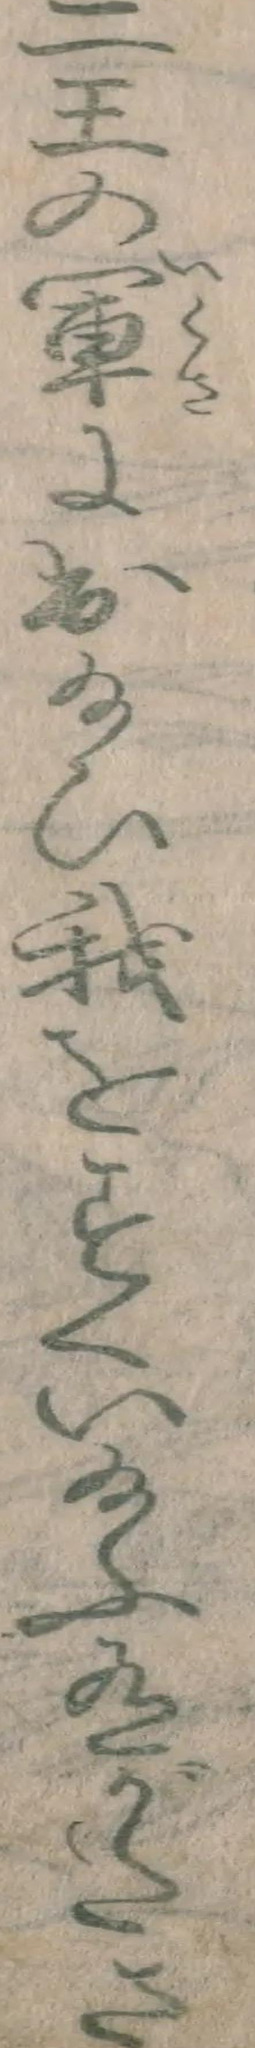二王の軍に出給ひ我をすくい給ふ有がたさ
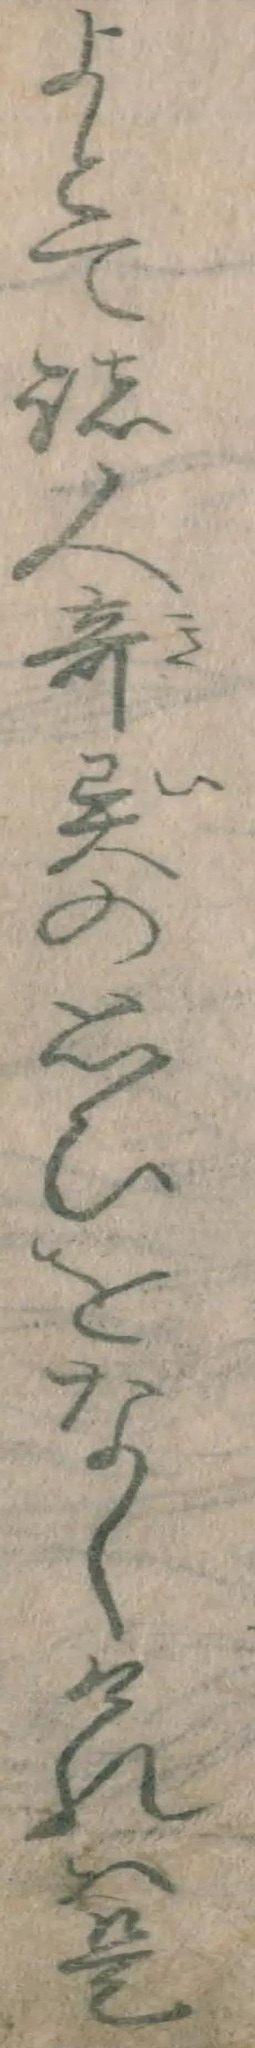よとて諸人奇異の思ひをなしけれは是
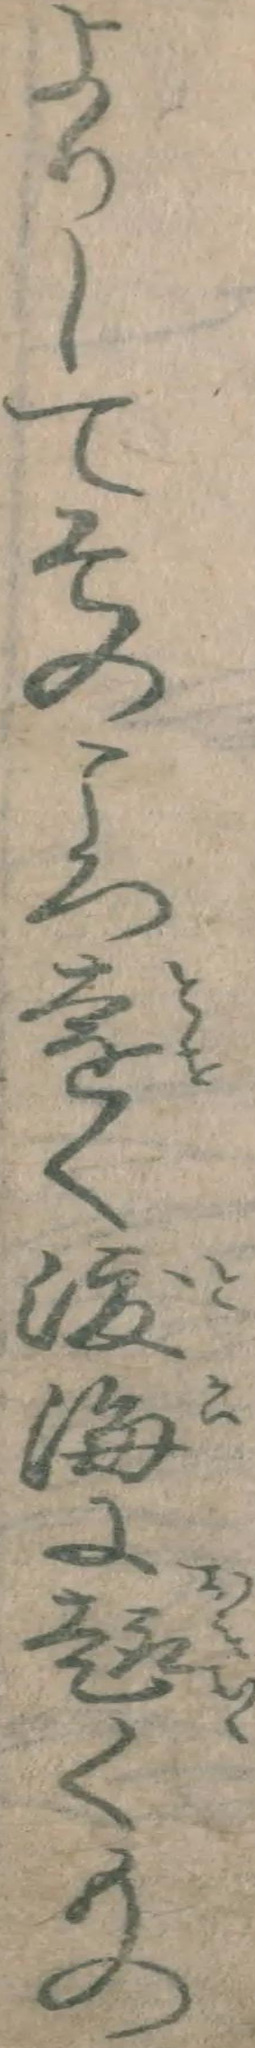よりしてそのころ遠く渡海に趣くもの

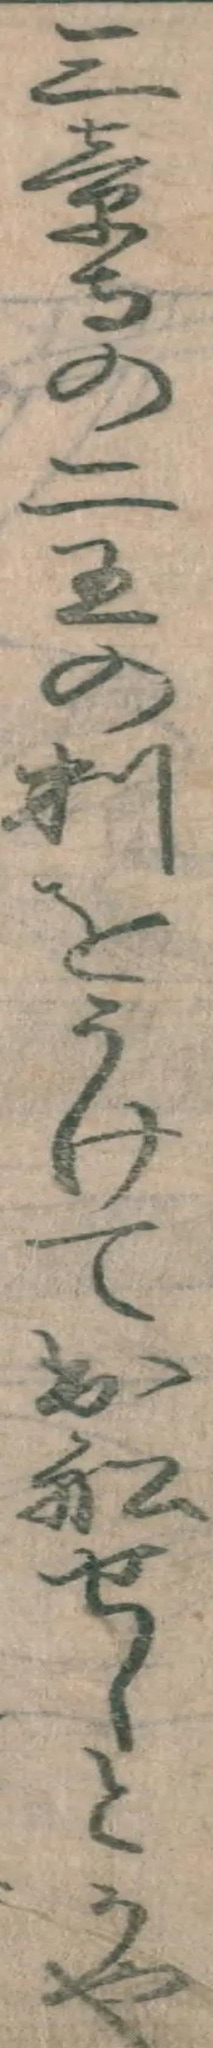三章寺の二王の判をうけて出船せしとかや
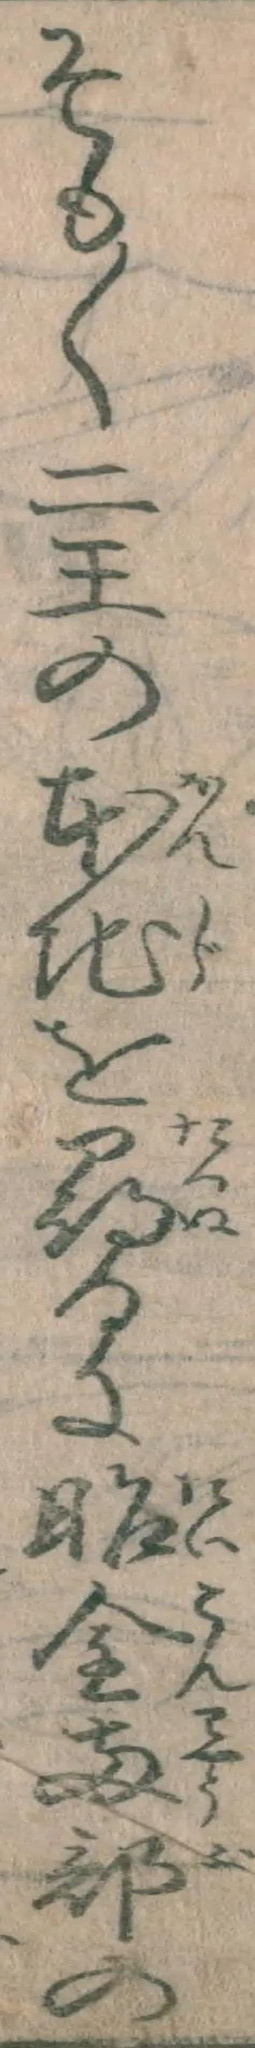そも〳〵二王の本地を尋るに胎金両部の
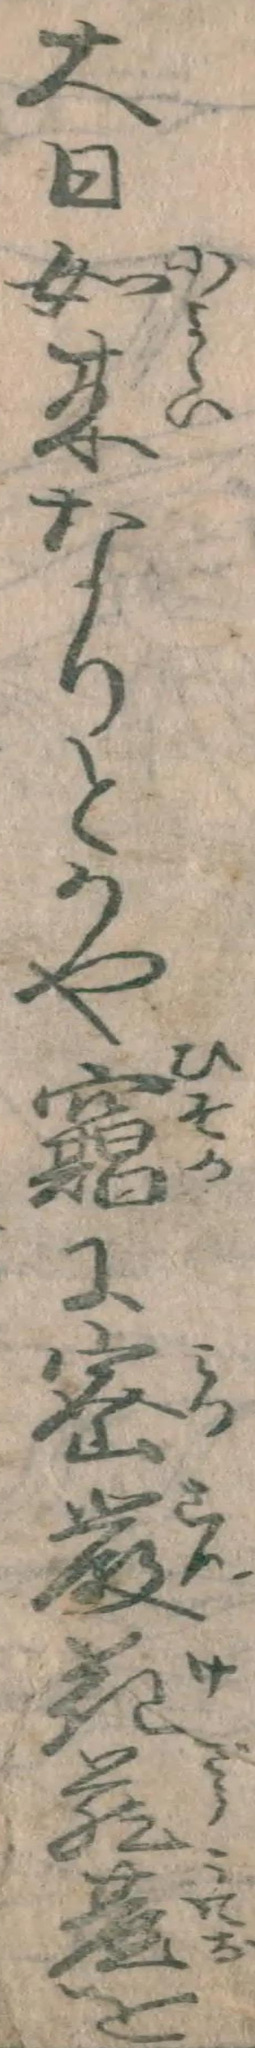大日如来なりとかや窃に密厳花蔵台を
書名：怪談御伽童 5巻. [1]
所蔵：国立国会図書館 National Diet Library, JAPAN
